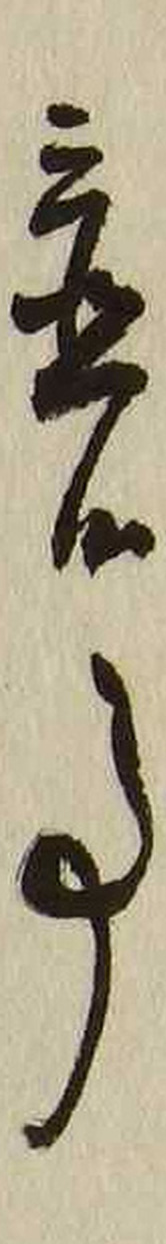置候事
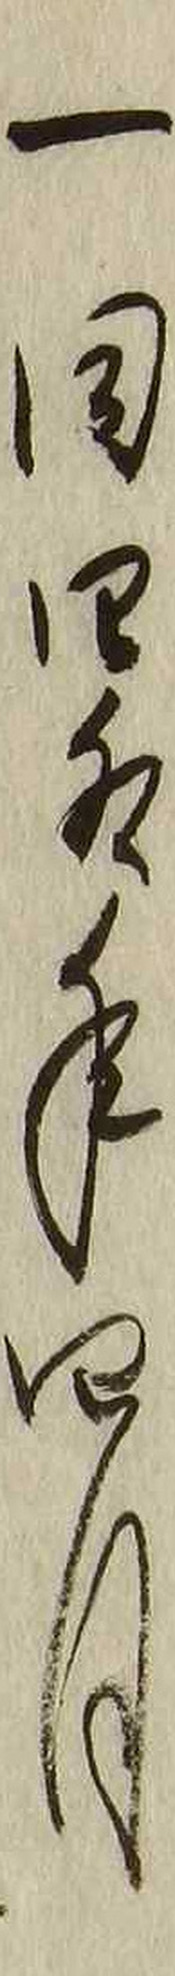一同四卯年四月
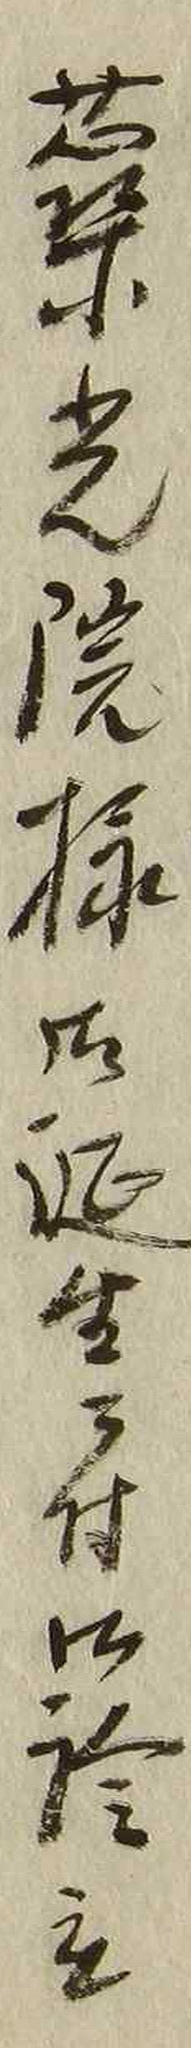蘂光院様御誕生ニ付御診被
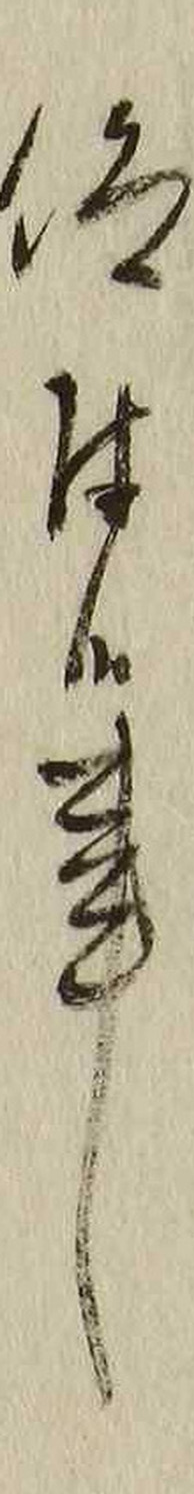仰付候事
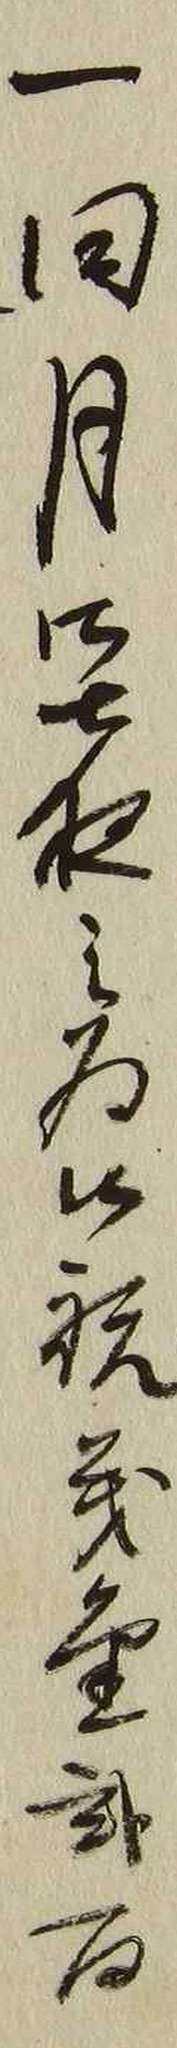一同月御七夜之為御祝義金弐百
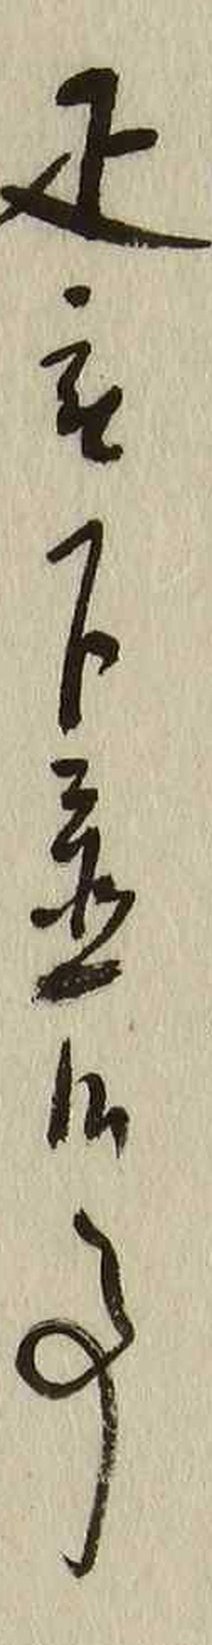疋被下置候事
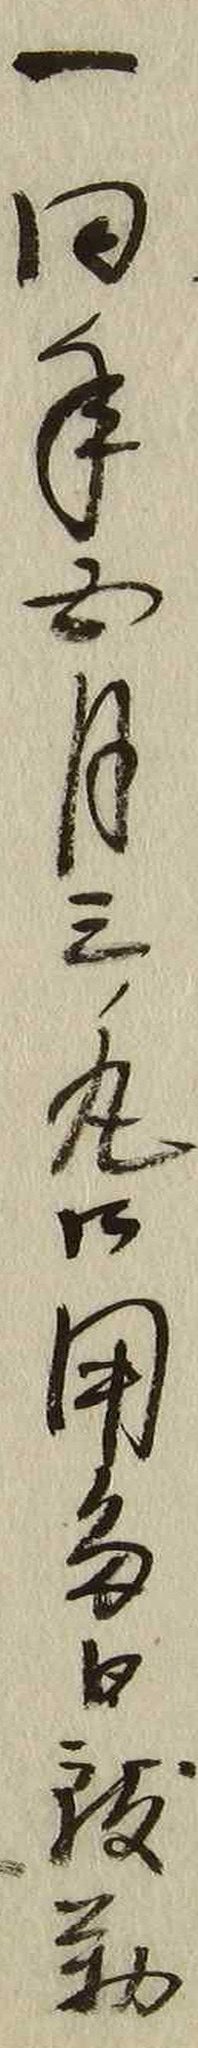一同年五月三ノ丸御用多日致勤
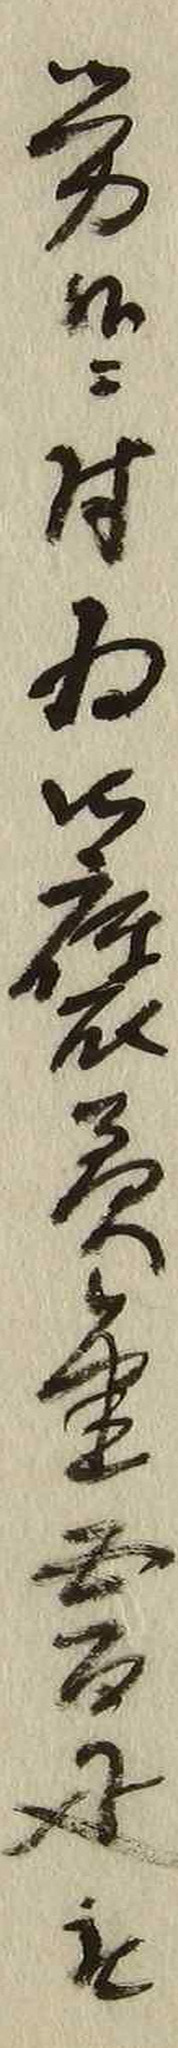労候ニ付為御褒美金五百疋被
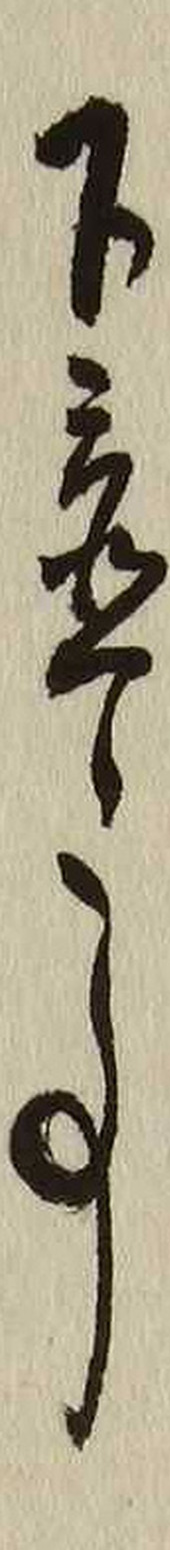下置候事
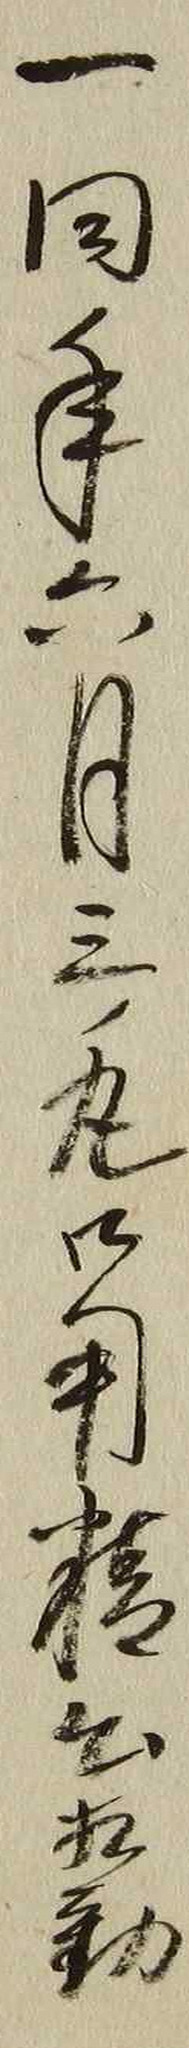一同年六月三ノ丸御用精出相勤
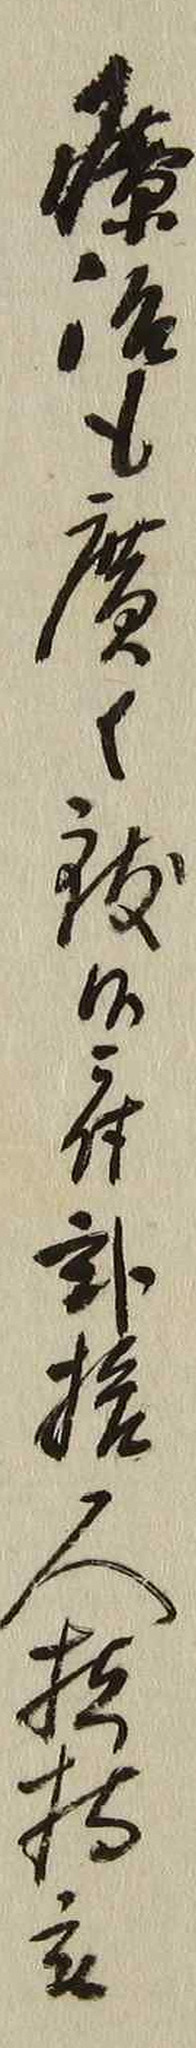療治も広く致候ニ付弐拾人扶持被
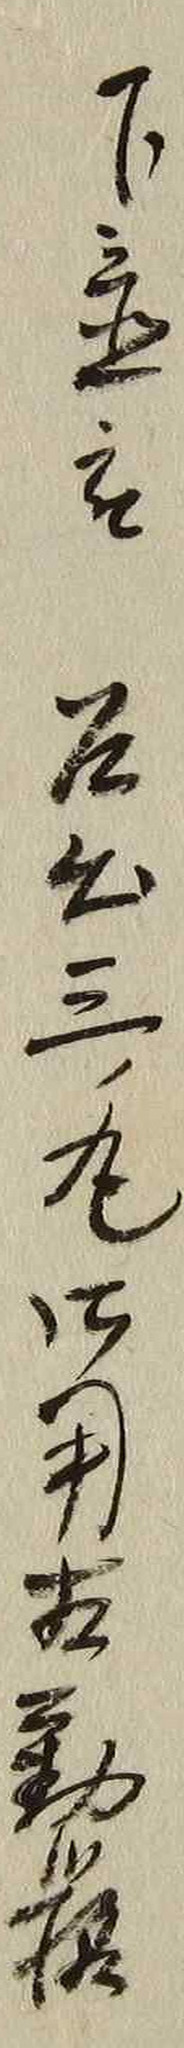下置被召出三ノ丸御用相勤候様
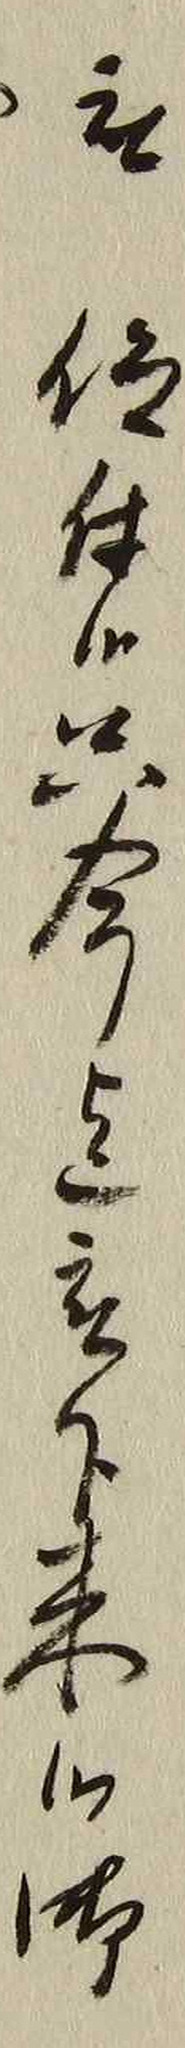被仰付候只今迄被下来候御
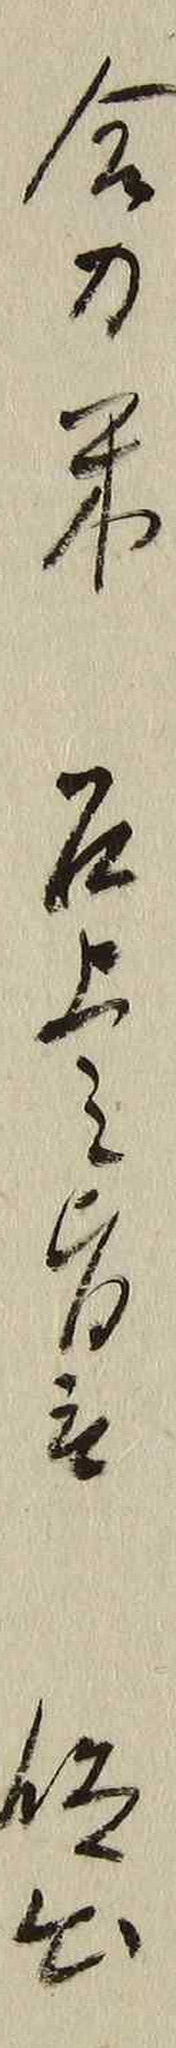合力米召上之旨被仰出
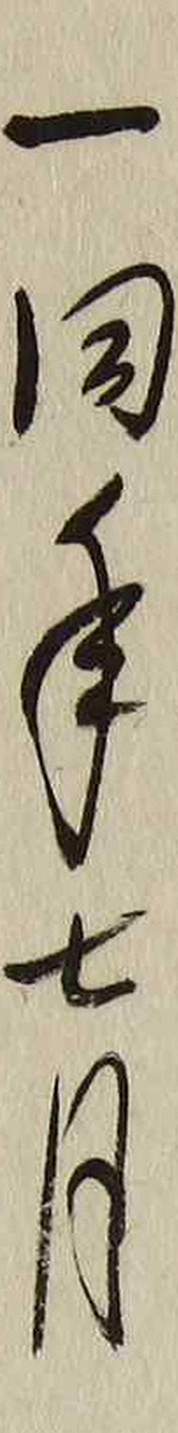一同年七月
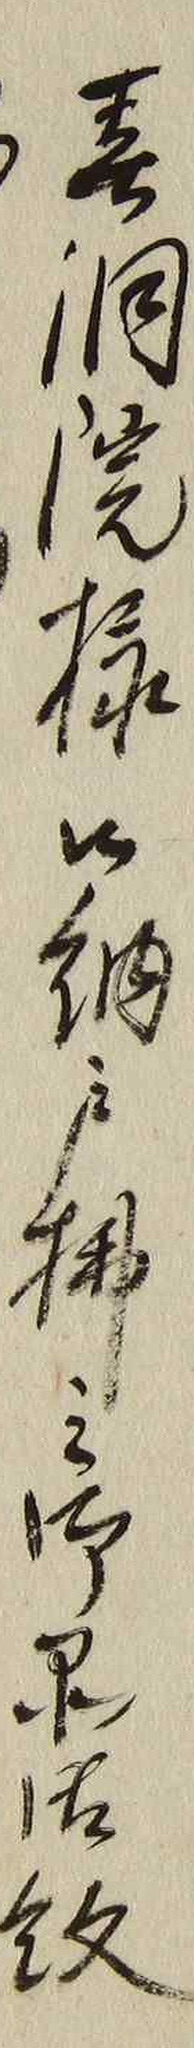春洞院様御納戸払之御品御紋
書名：諸士系譜　巻之353　す之部3
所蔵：会津若松市立会津図書館
